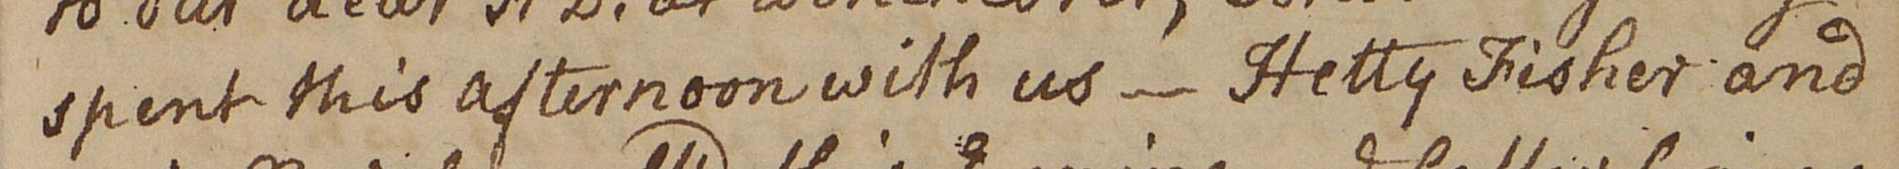spent this afternoon with us- Hetty Fisher and
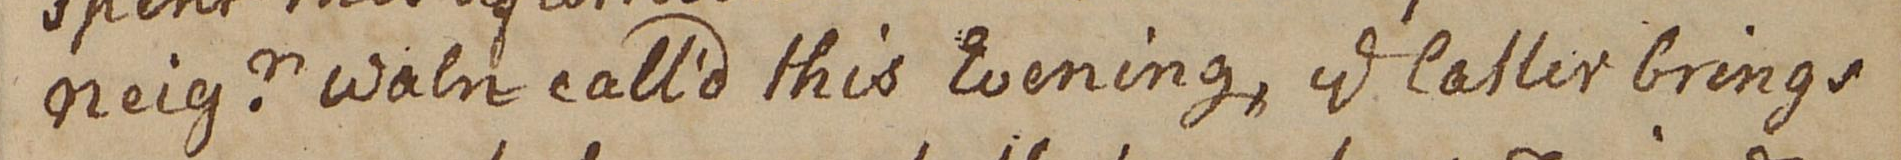Neig^r. Waln call'd this Evening, y^e Caller brings
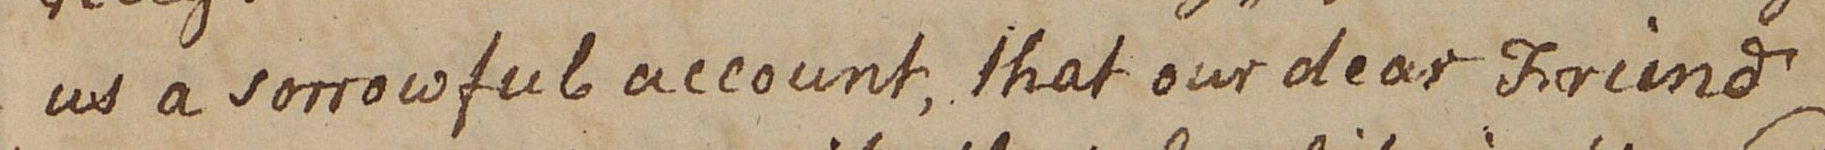us a sorrowful account, that our dear Friend
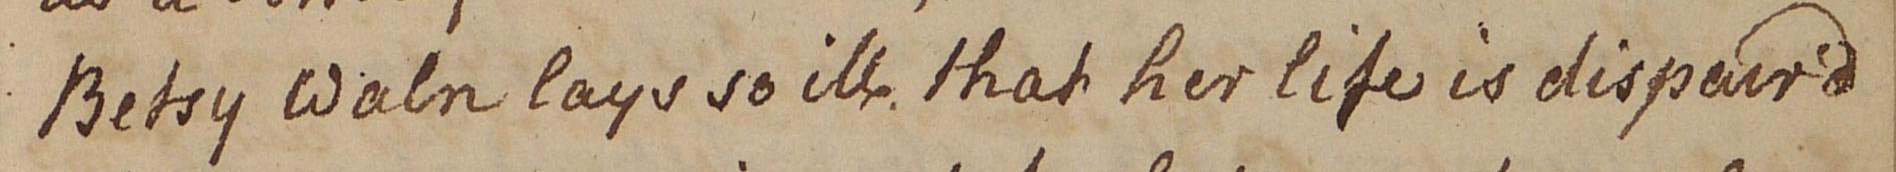Betsy Waln lays so ill that her life is dispair'd
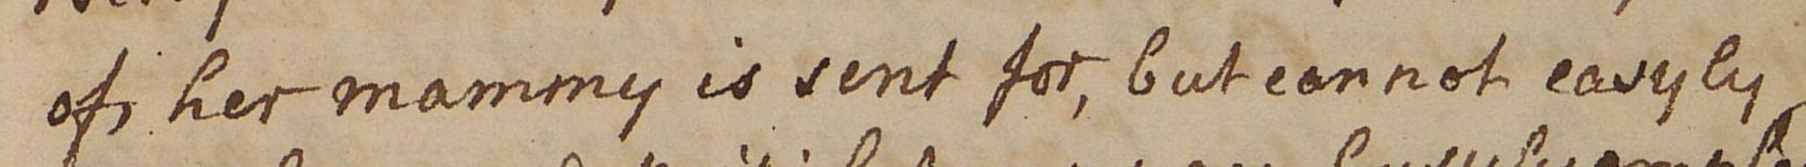of her mammy is sent for, but cannot easyly
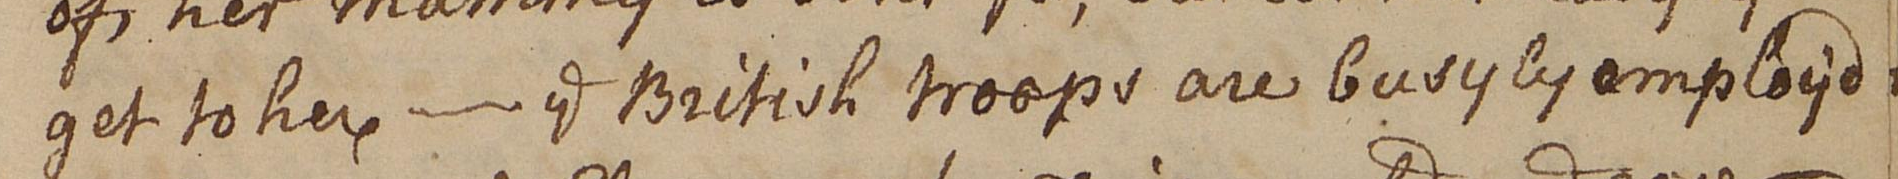get to her- y^e British troops are busyly employ'd
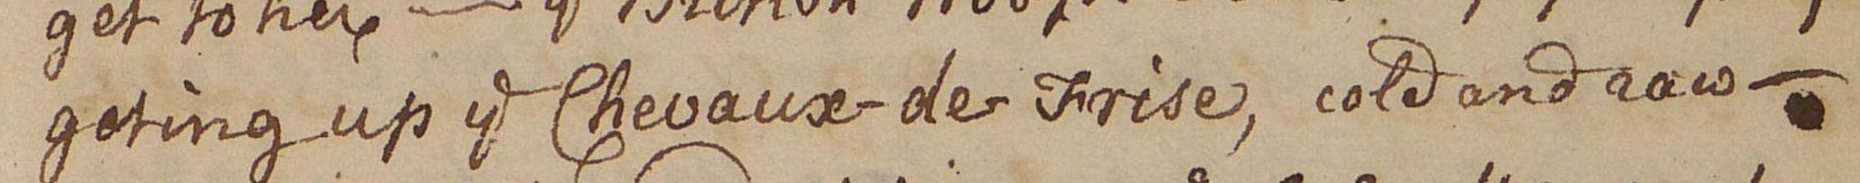geting up y^e Chevaux-de-Frise, cold and raw-
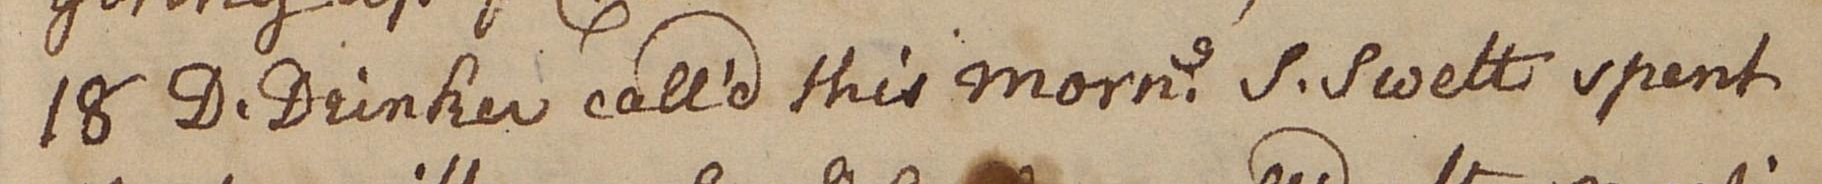18 D. Drinker call'd this morn^g. S. Swelt spent
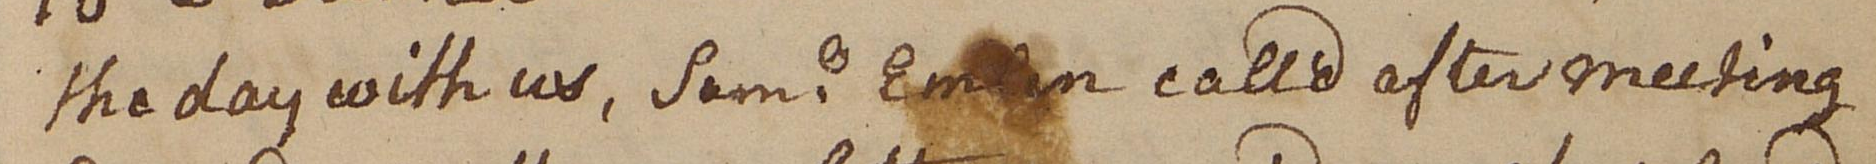the day with us, Sam^l. Emlen call'd after meeting
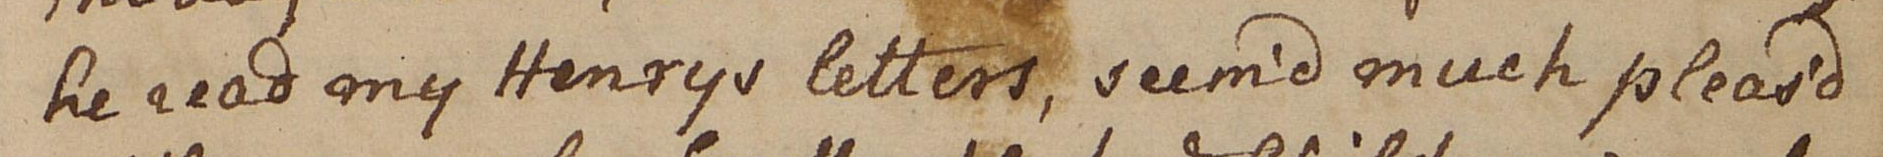he read my Henrys letters, seem'd much pleas'd
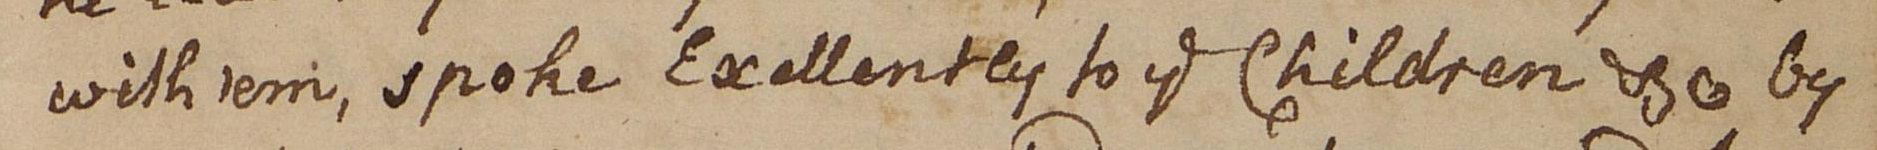with 'em, spoke Exellently to y^e Children &c by
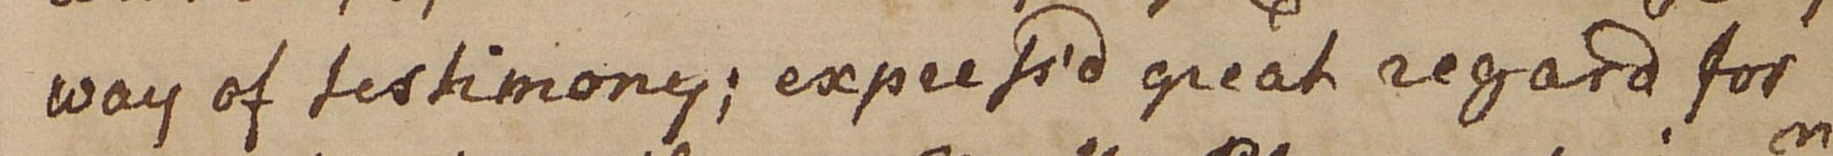way of testimony; express'd great regard for
